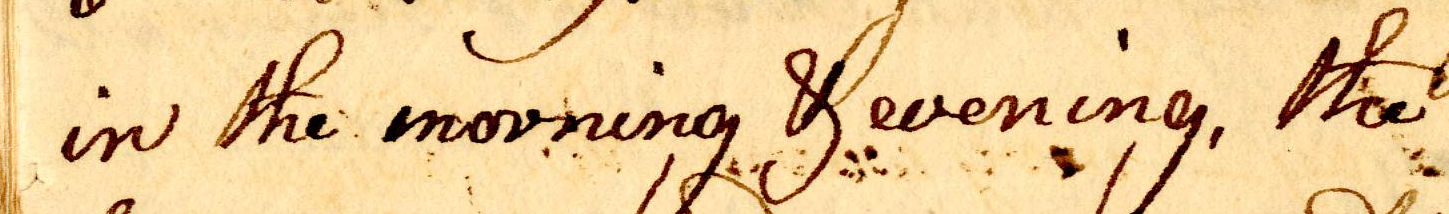in the morning & evening, the
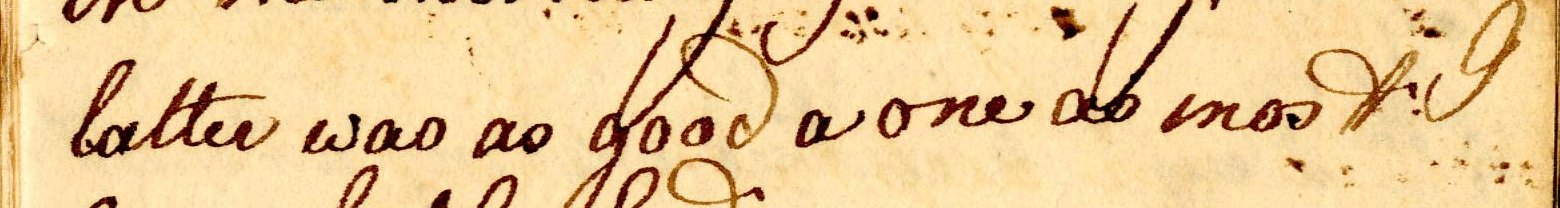latter was as good a one as most I
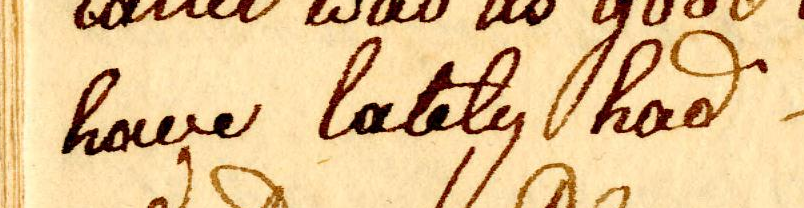have lately had
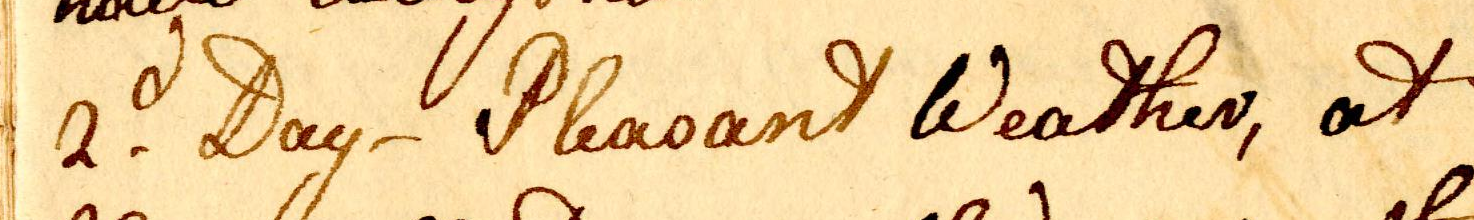2^d. Day- Pleasant Weather, at
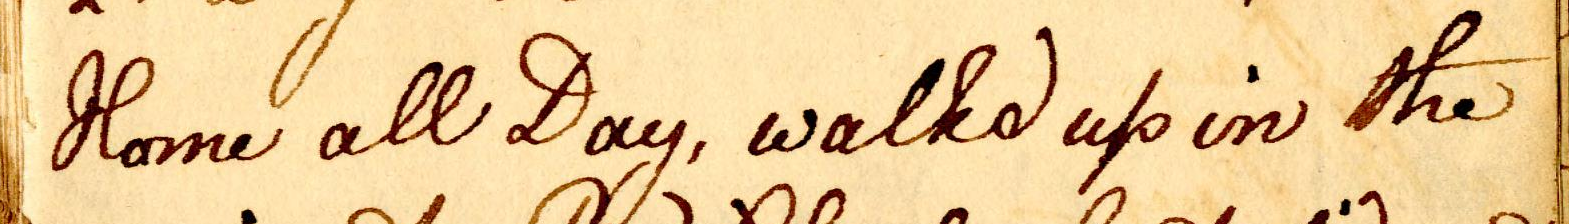Home all Day, walkd up in the
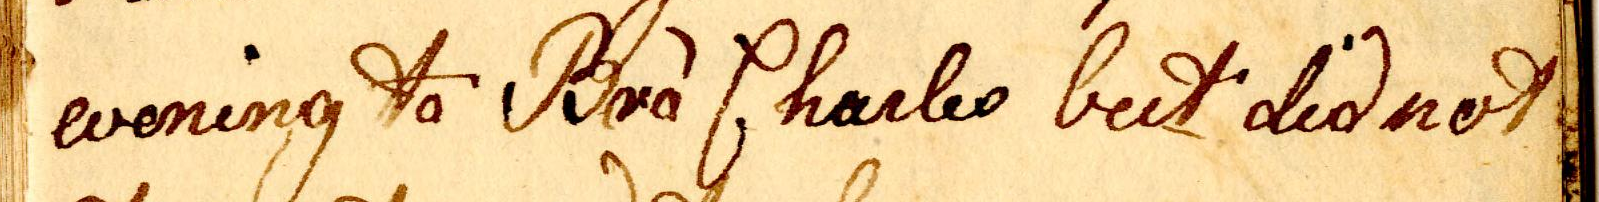evening to Bro' Charles but did not
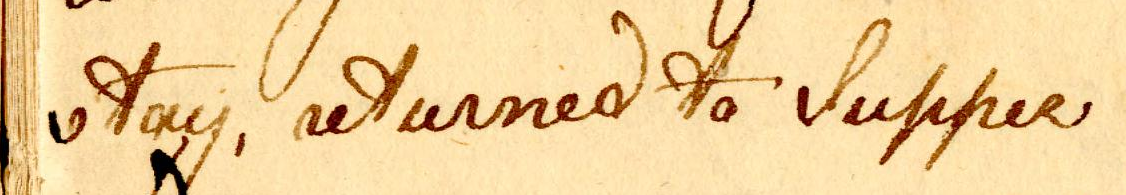stay, returned to Supper
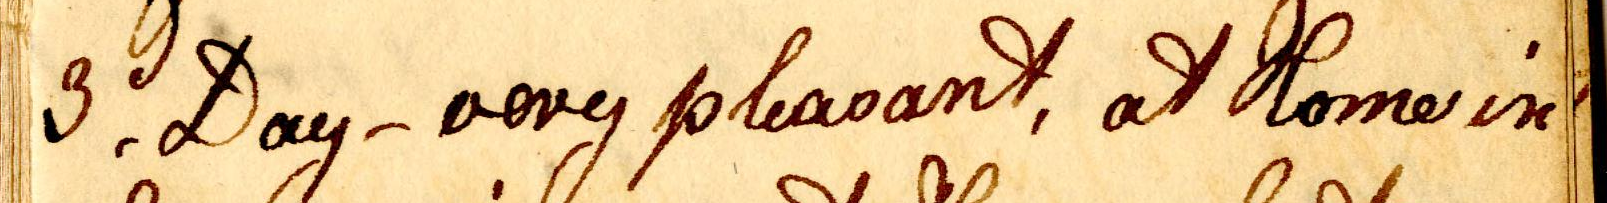3^d. Day- very pleasant, at Home in
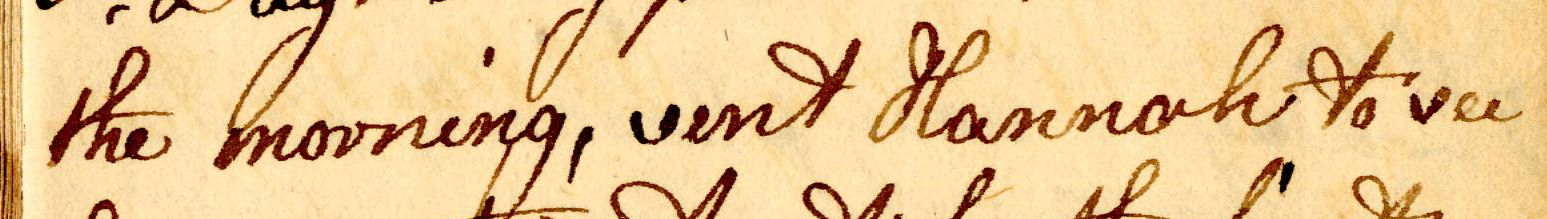the morning, sent Hannah to see
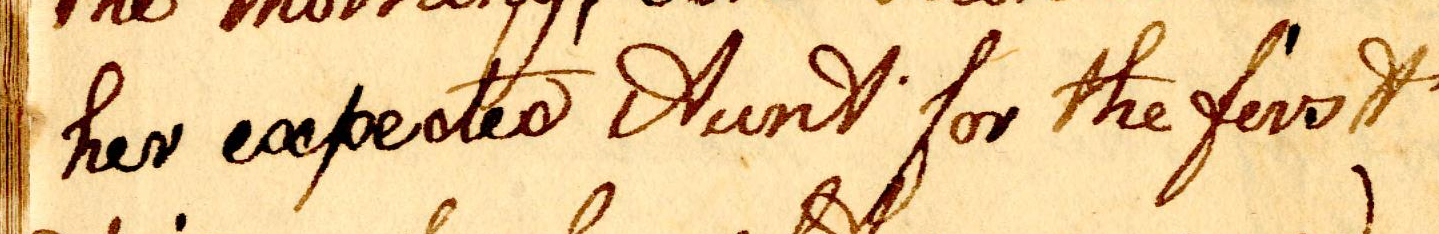her expected Aunt for the first
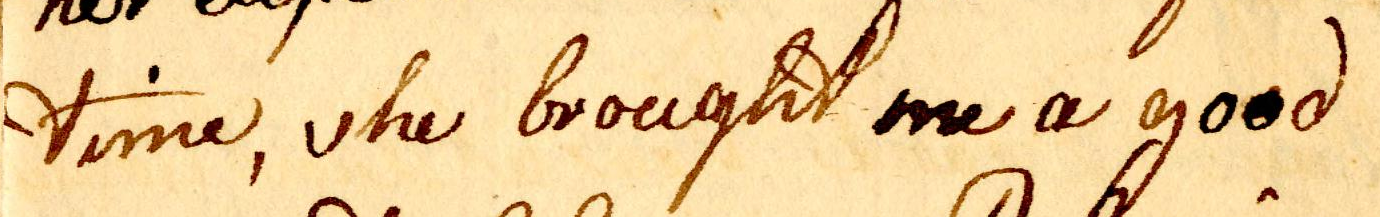time, she brought me a good
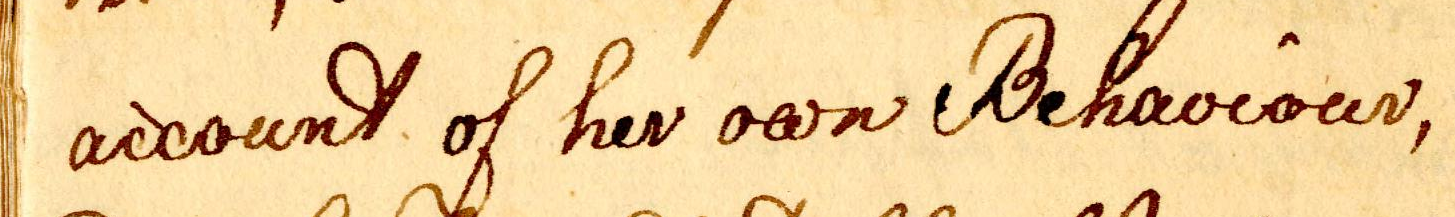account of her own Behaviour,
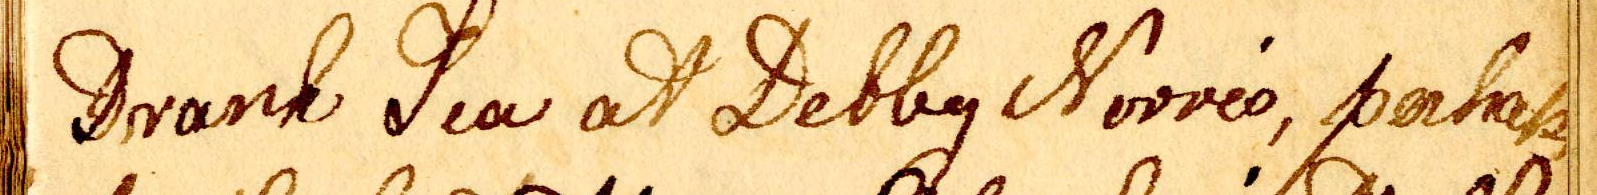Drank Tea at Debby Norris, perhaps
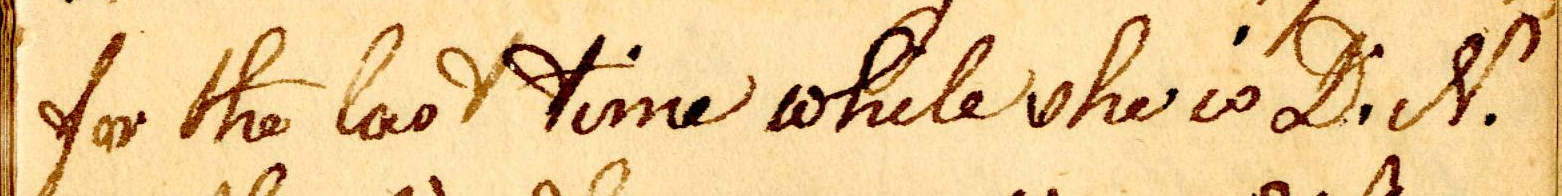for the last time while she is D.N.
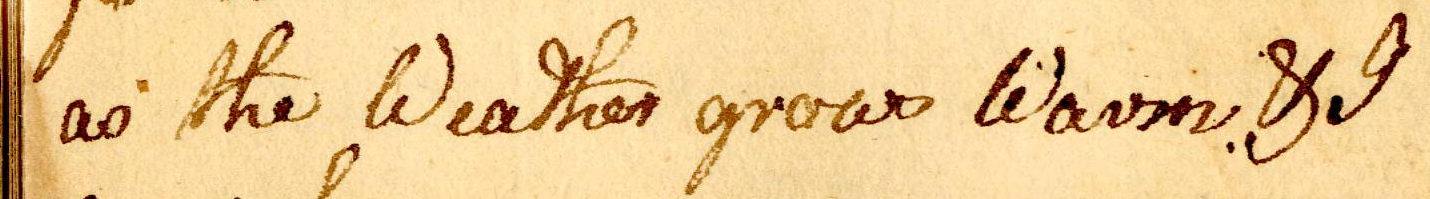as the Weathr grows Warm & I
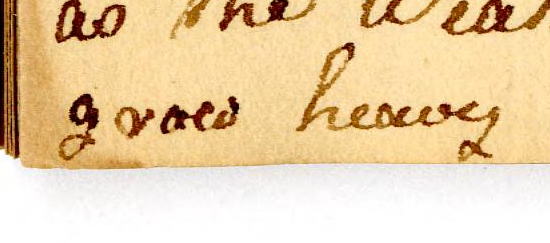grow heavy
